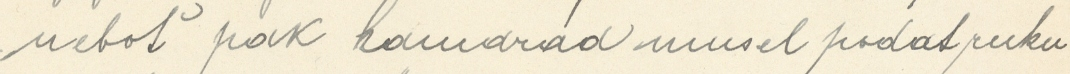neboť pak kamarád musel podat ruku
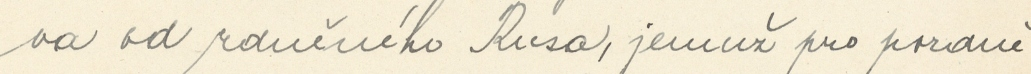va od raněného Rusa, jemuž pro poraně-
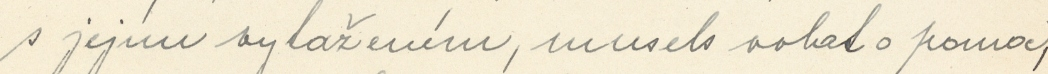s jejím vytažením, musels volat o pomoc,
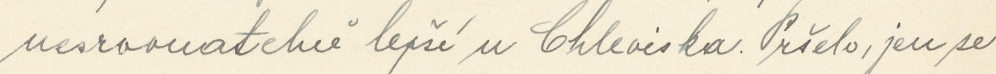nesrovnatelně lepší u Chleviska. Pršelo, jen se
